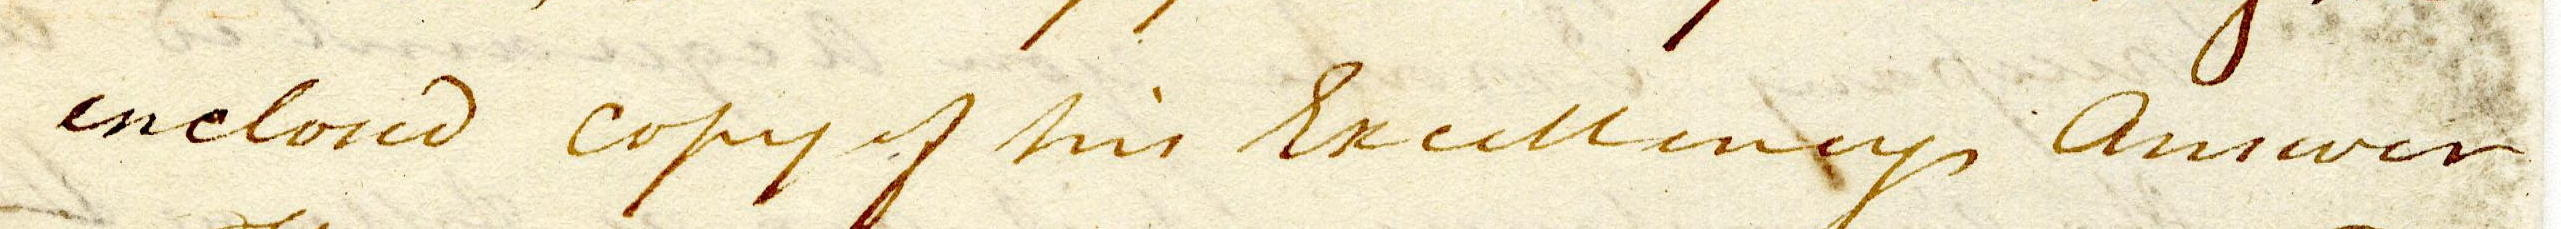enclosed copy of his Excellency Answer
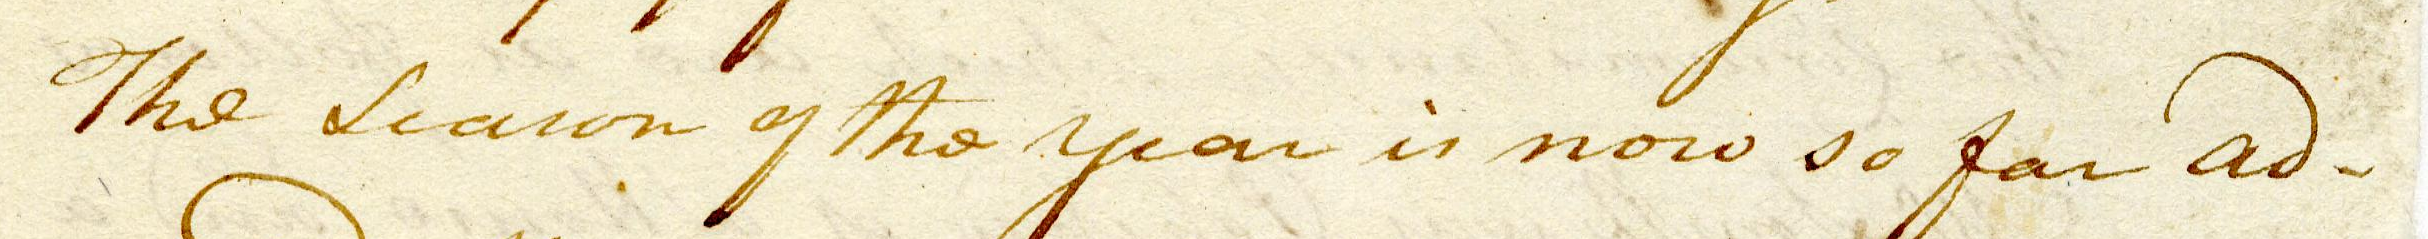The season of the year is now so far ad-
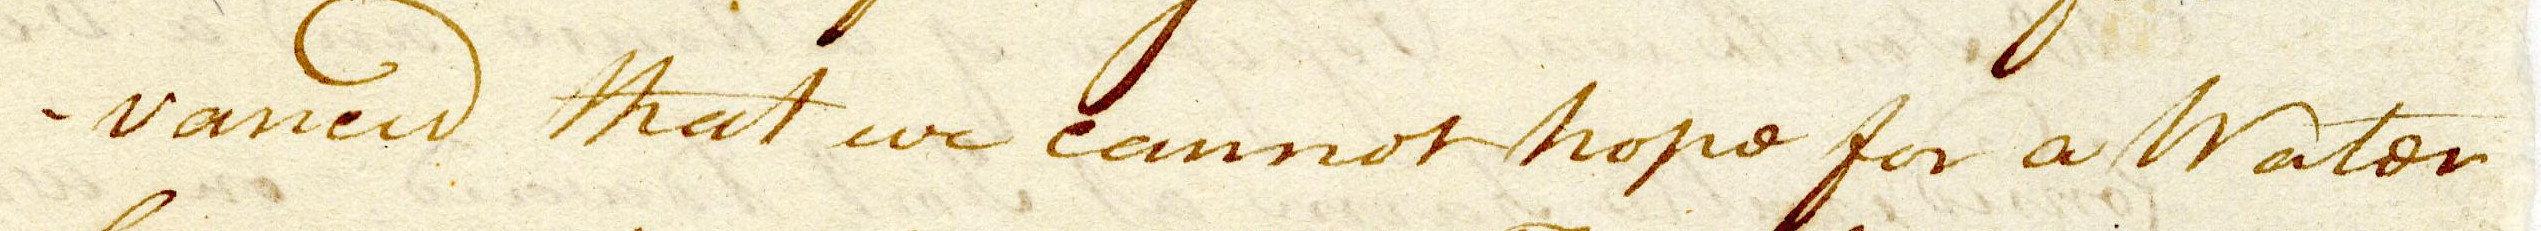-vanced that we cannot hope for a Water
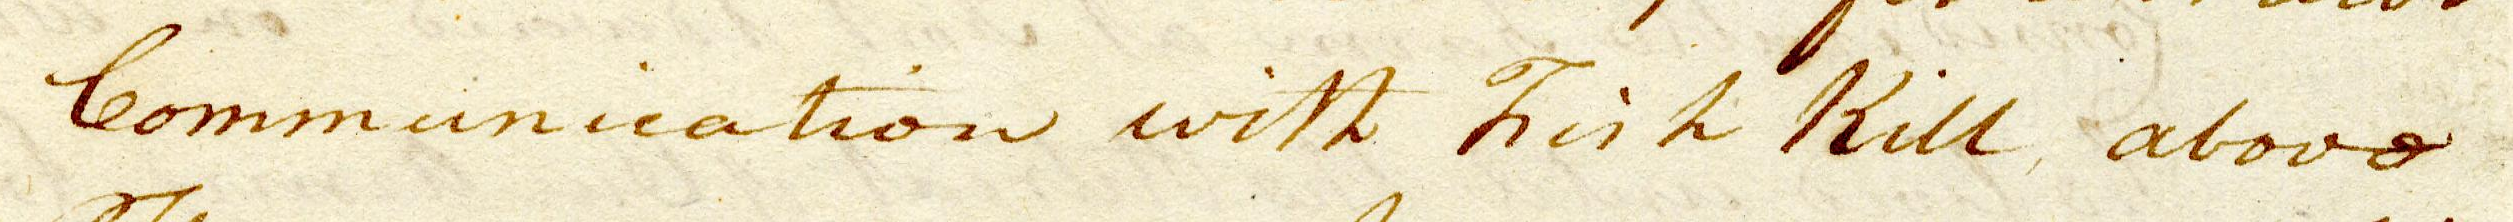Communication with Fish Kill above
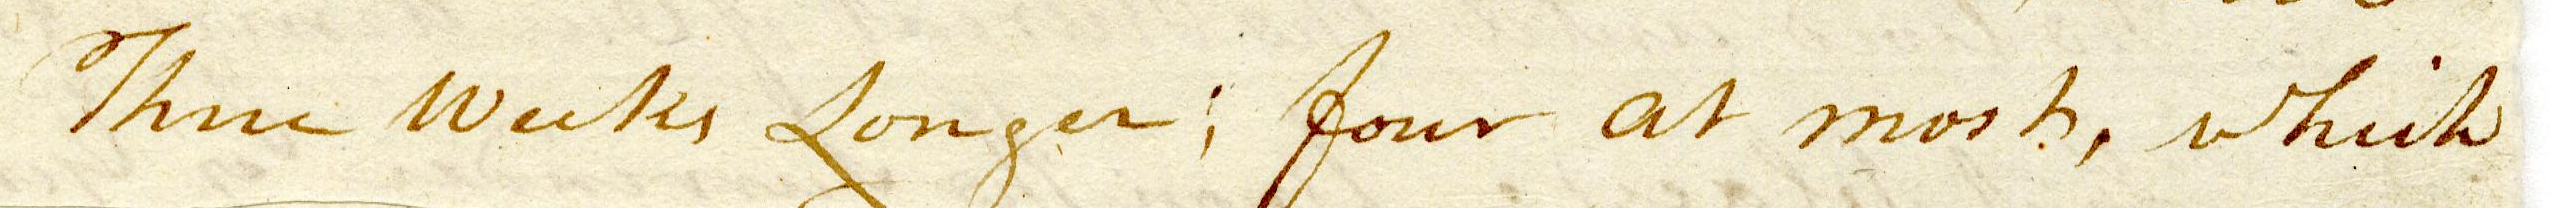Three Weeks Longer; four at most, which
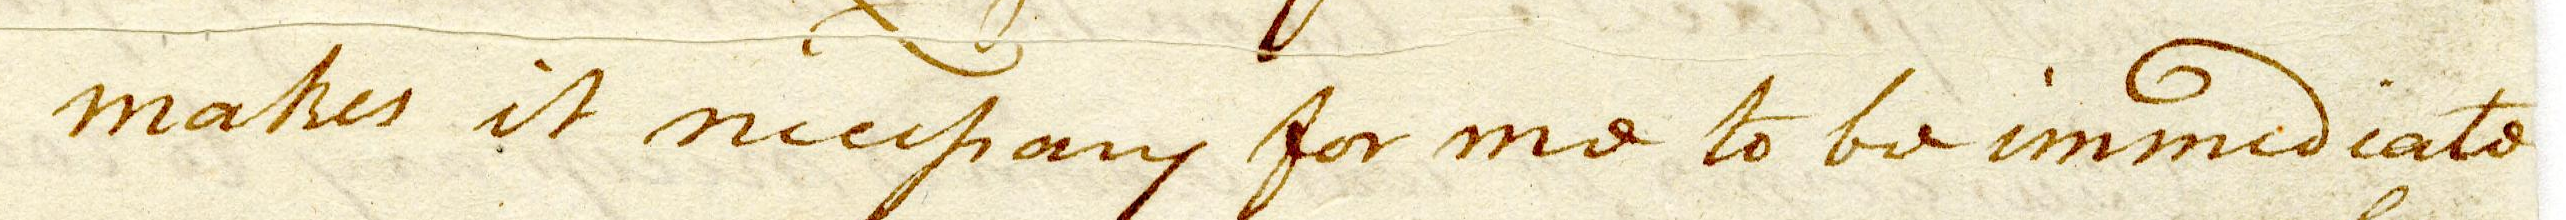makes it necessary for me to be immediate
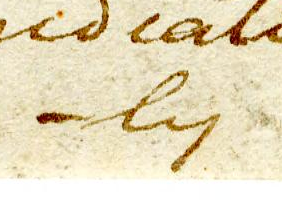-ly
